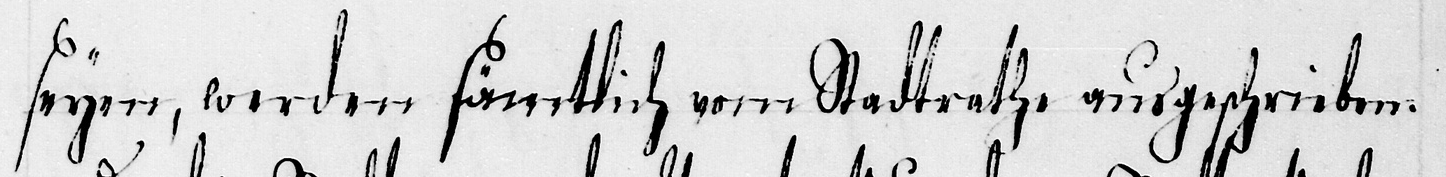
seyen, werden sämtlich vom Stadtrathe ausgeschrieben.
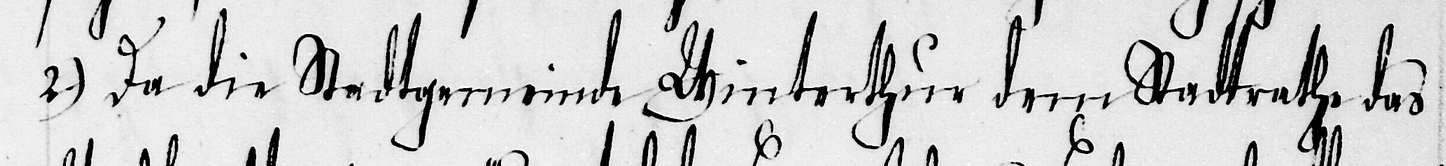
2.) Da die Stadtgemeinde Winterthur dem Stadtrathe das
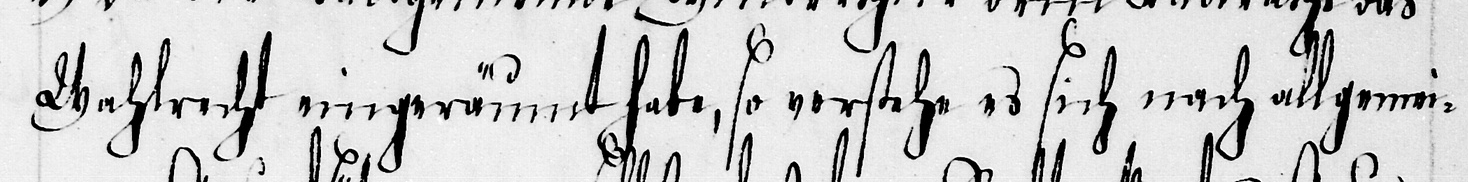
Wahlrecht eingeräumt habe, so verstehe es sich nach allgeme¬
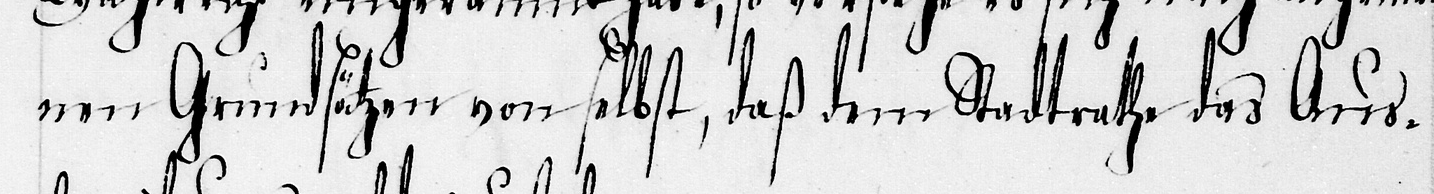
inen Grundsätzen von selbst, daß dem Stadtrathe das Aus¬
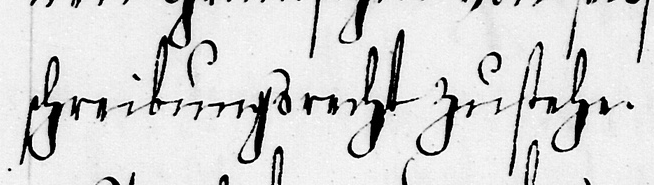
schreibungsrecht zustehe.
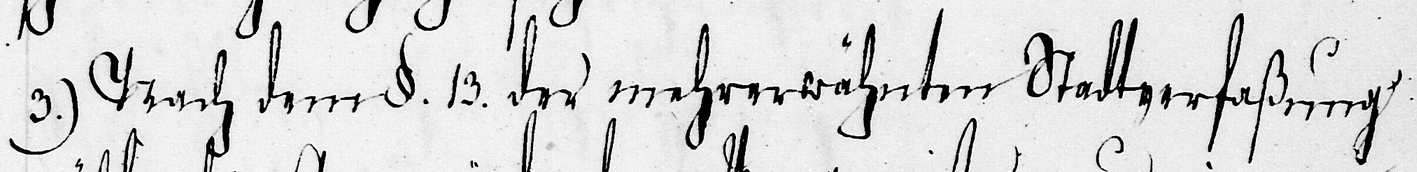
3.) Nach dem §. 13. der mehrerwähnten Stadtverfaßung
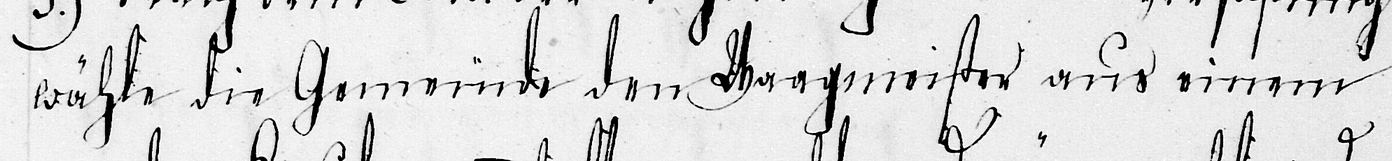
wähle die Gemeinde den Waagmeister aus einem
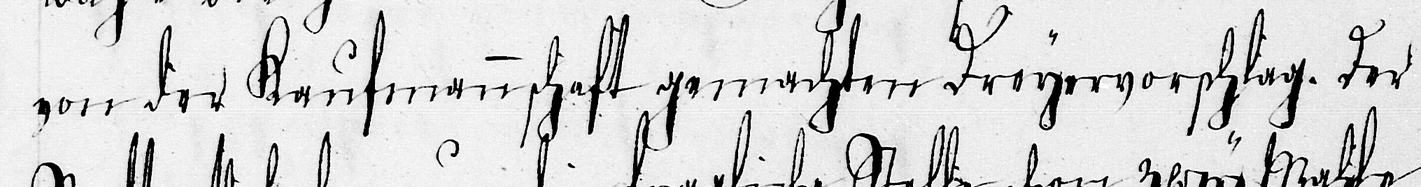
von der Kaufmannschaft gemachten Dreyervorschlag. Der
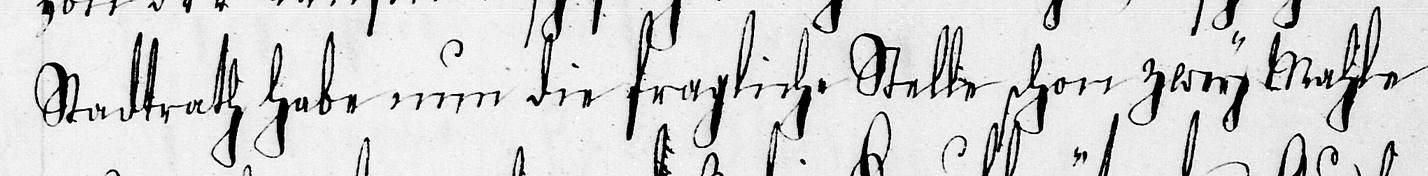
Stadtrath habe nun die fragliche Stelle schon zwey Mahle
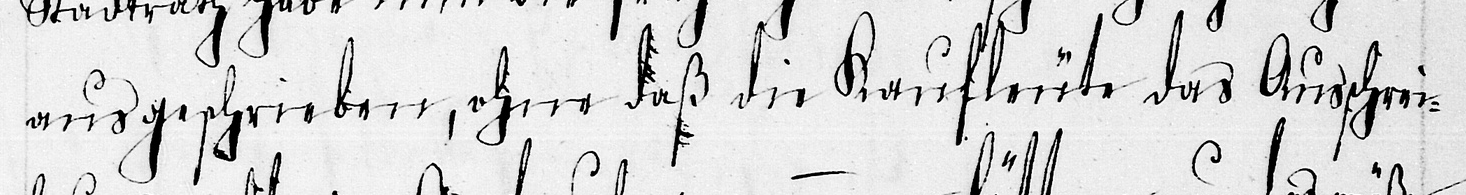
ausgeschrieben, ohne daß die Kaufleute das Ausschrei¬
